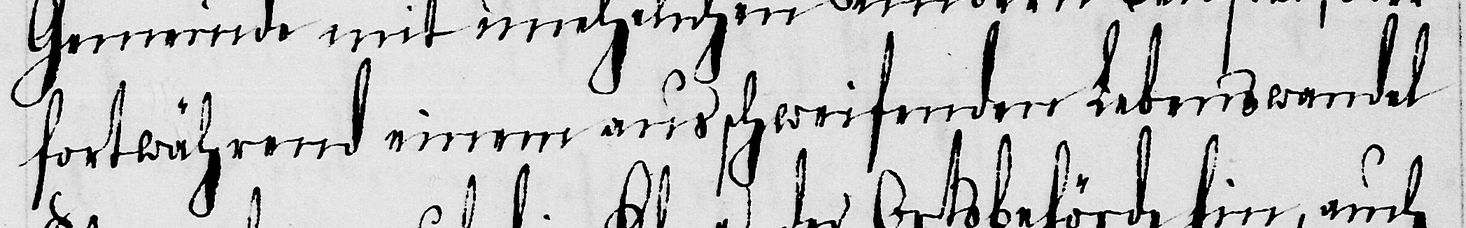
fortwährend einem ausschweifenden Lebenswandel
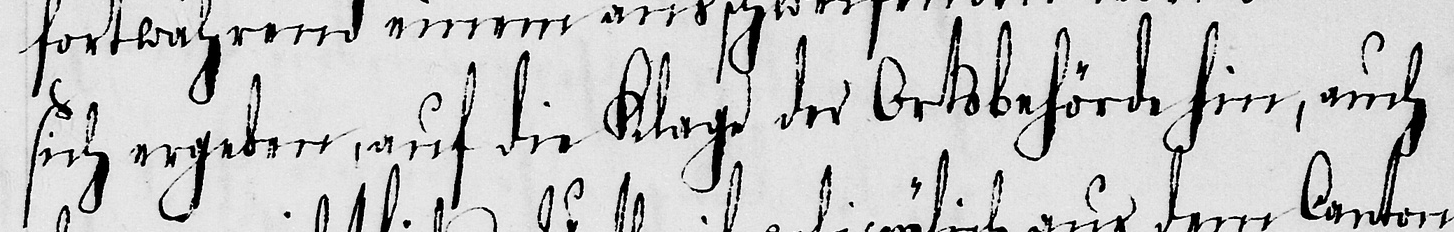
sich ergeben, auf die Klage der Ortsbehörde hin, auch
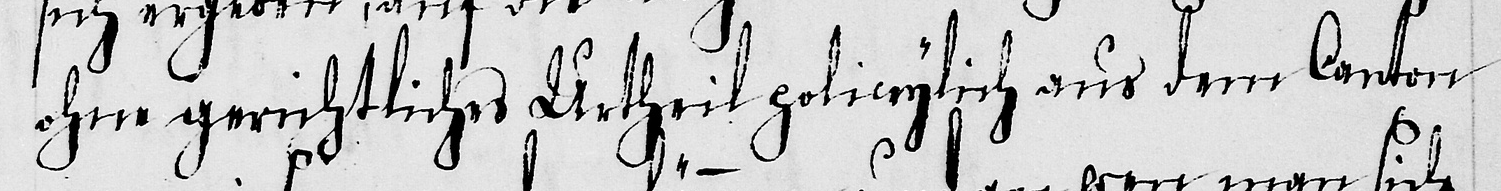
ohne gerichtliches Urtheil policeylich aus dem Canton
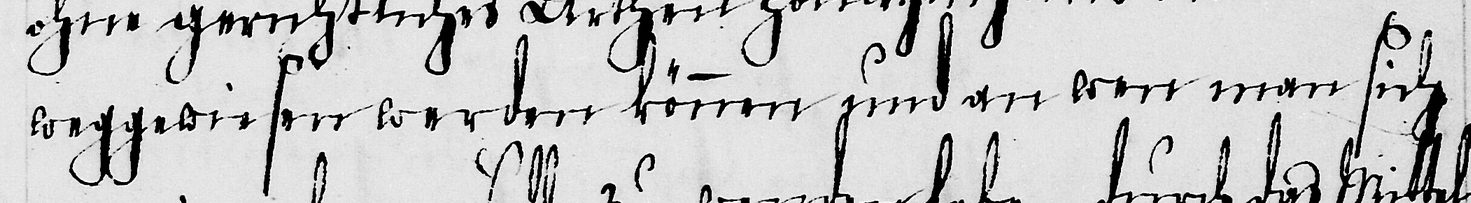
weggewiesen werden können und an wen man sich
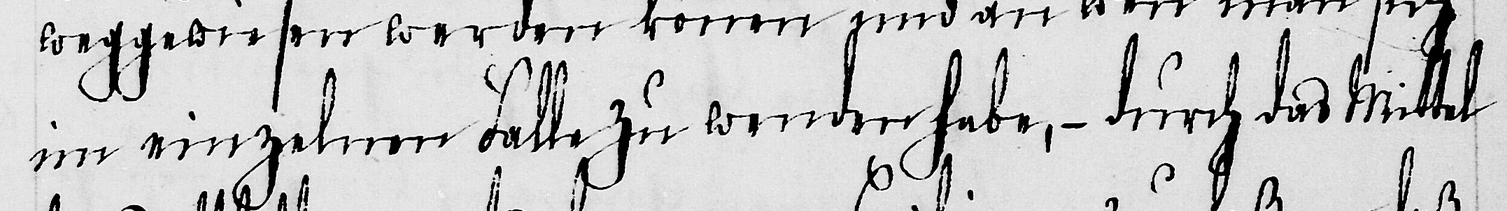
im einzelnen Falle zu wenden habe, – durch das Mittel
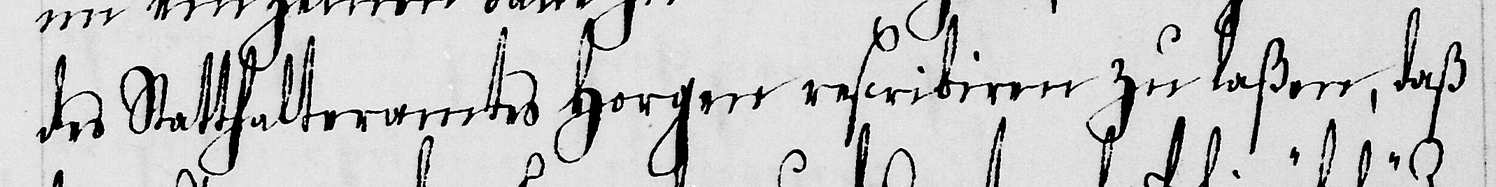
des Statthalteramtes Horgen rescribiren zu laßen, daß
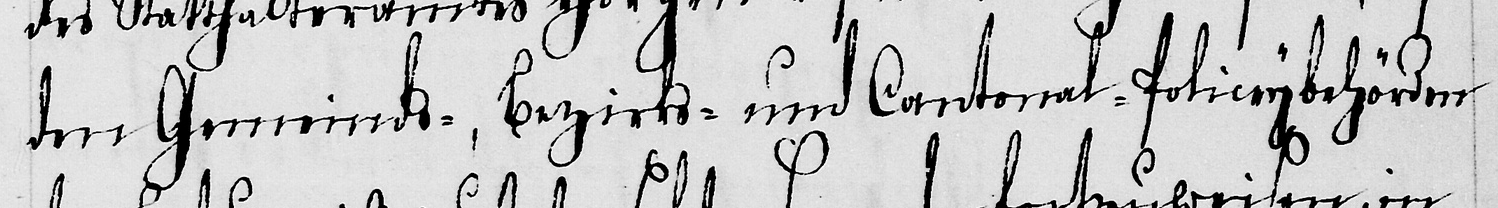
den Gemeinds-, Bezirks- und Cantonal-Policeybehörden
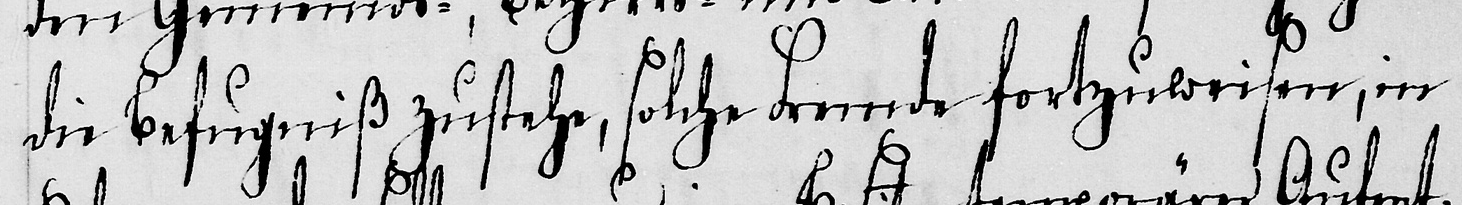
die Befugniß zustehe, solche Fremde fortzuweisen, in
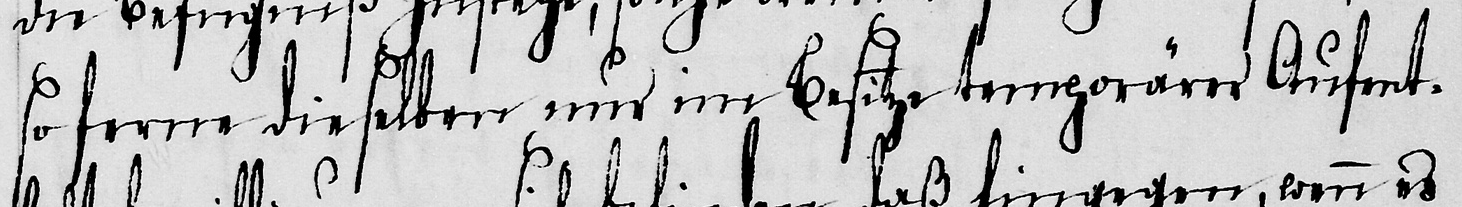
so ferne dieselben nur im Besitze temporärer Aufent¬
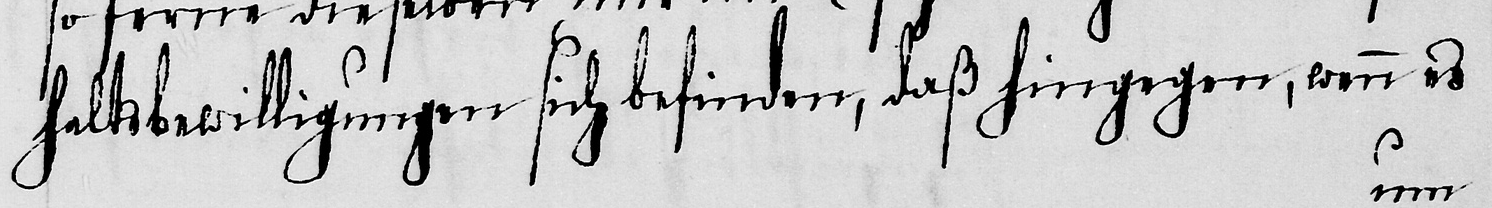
haltsbewilligungen sich befinden, daß hingegen, wenn es
